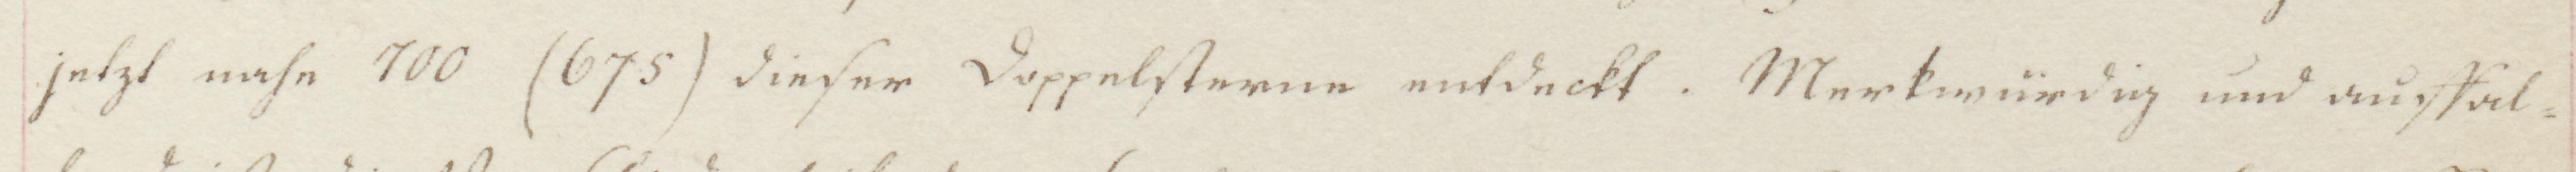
jetzt nahe 700 dieser Doppelsterne entdeckt. Merkwürdig und auffal-
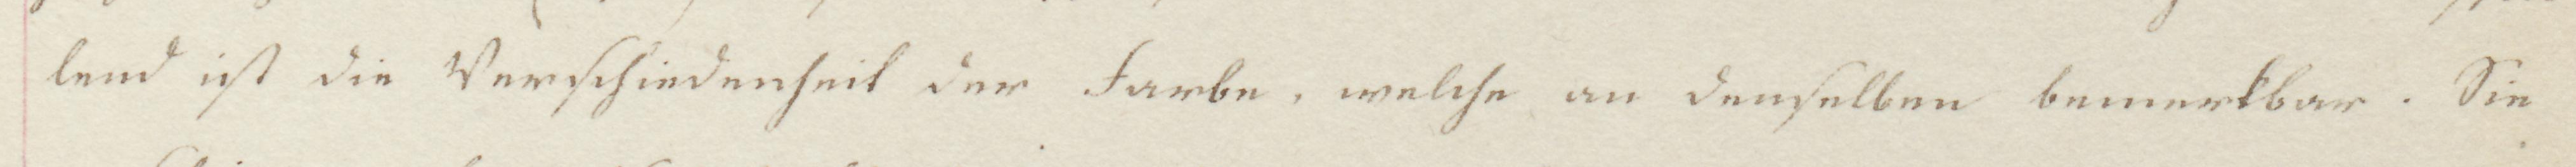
lend ist die Verschiedenheit der Farbe, welche an denselben bemerkbar. Sie
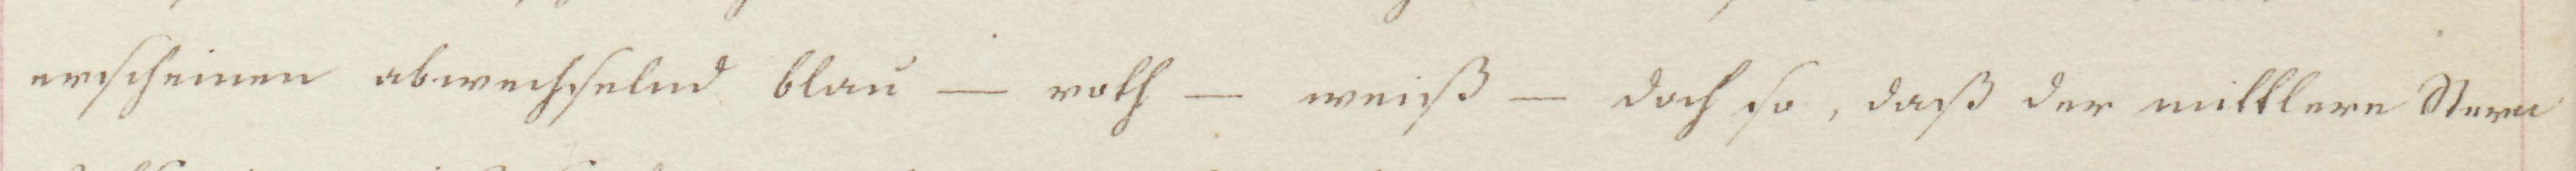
erscheinen abwechselnd blau – roth – weiß – doch so, daß der mittlere Stern
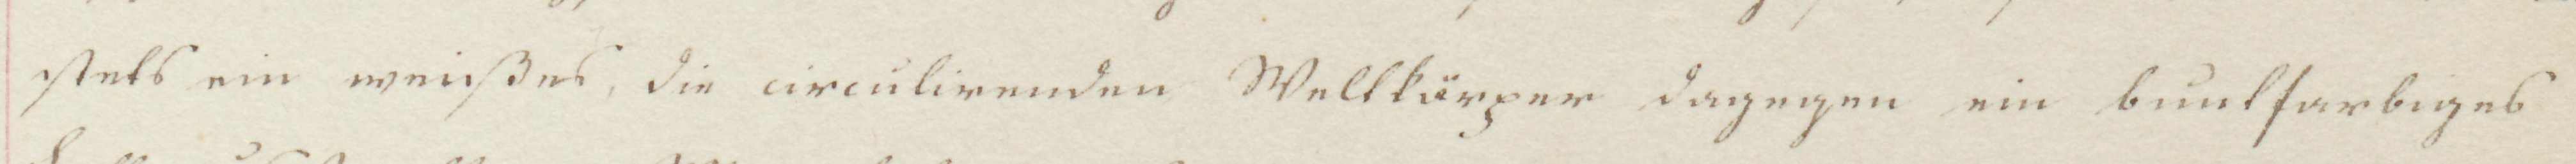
stets ein weißes, die circulirenden Weltkörper dagegen ein buntfarbiges
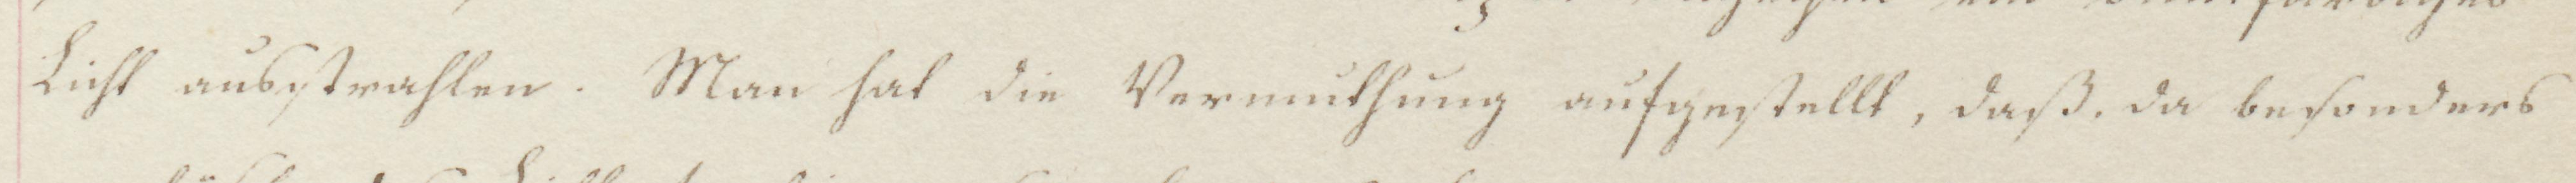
Licht ausstrahlen. Man hat die Vermuthung aufgestellt, daß, da besonders
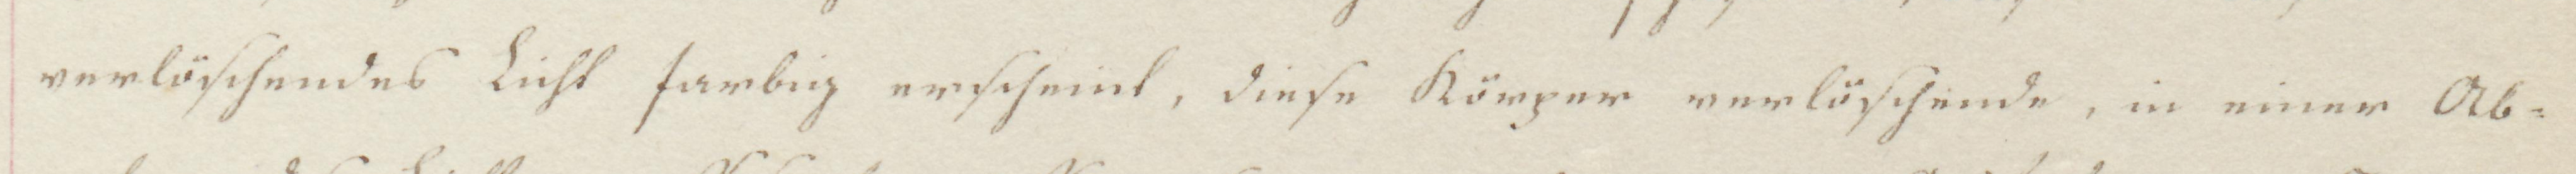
verlöschendes Licht farbig erscheint, diese Körper verlöschende, in einer Ab-
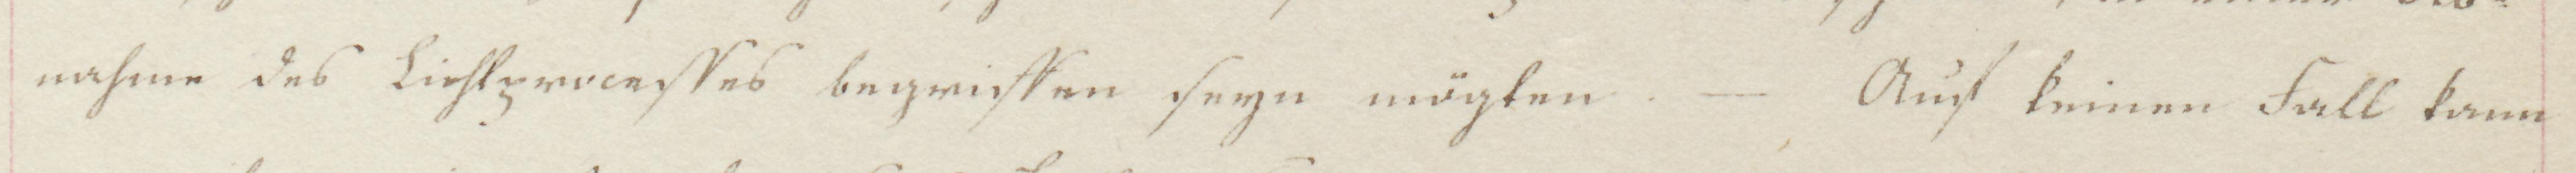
nahme des Lichtprocesses begriffen seyn mögten. – Auf keinen Fall kann
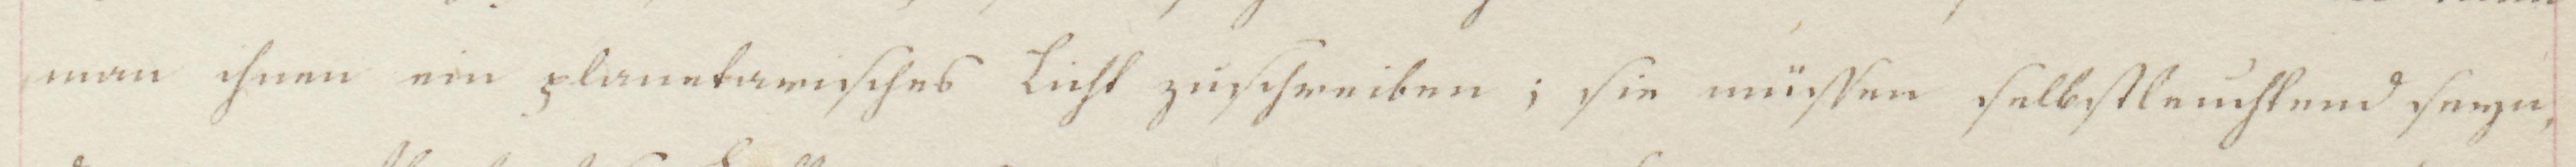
man ihnen ein planetarisches Licht zuschreiben; sie müssen selbstleuchtend seyn,
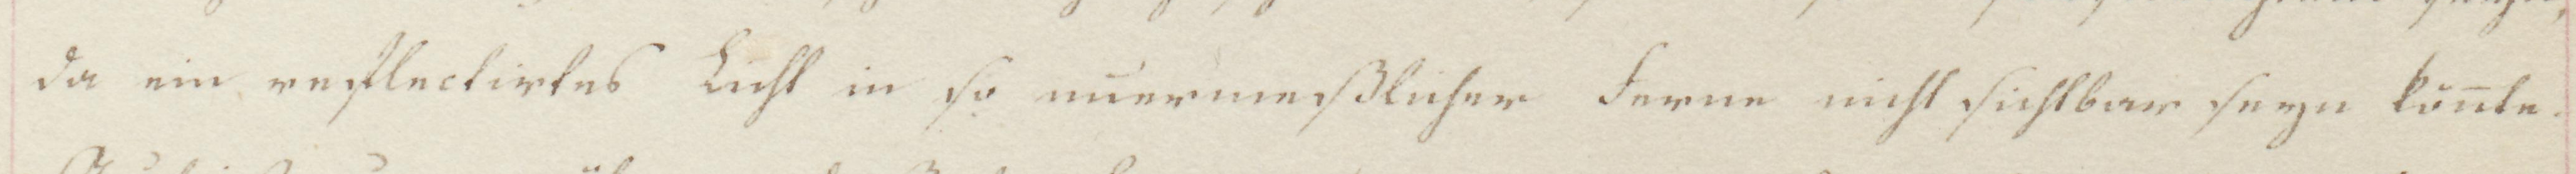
da ein reflectirtes Licht in so unermeßlicher Ferne nicht sichtbar seyn köñte.
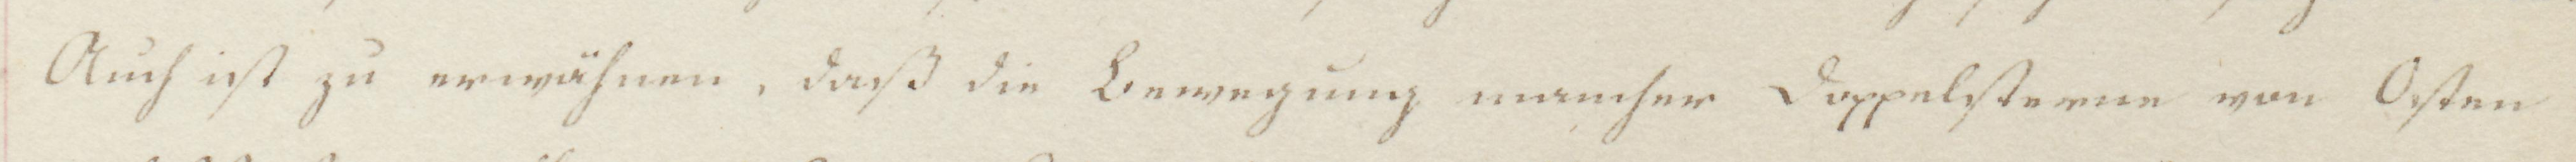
Auch ist zu erwähnen, daß die Bewegung mancher Doppelsterne von Osten
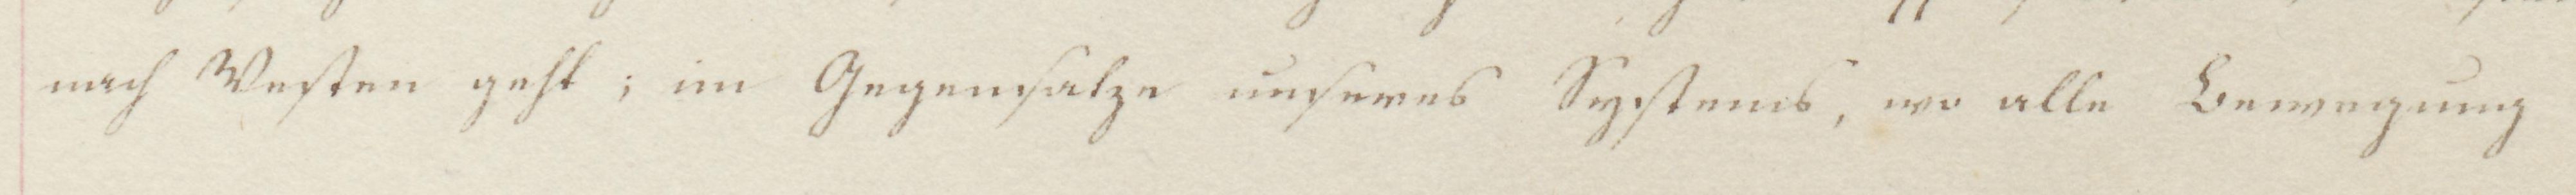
nach Westen geht; im Gegensatze unseres Systems, wo alle Bewegung
